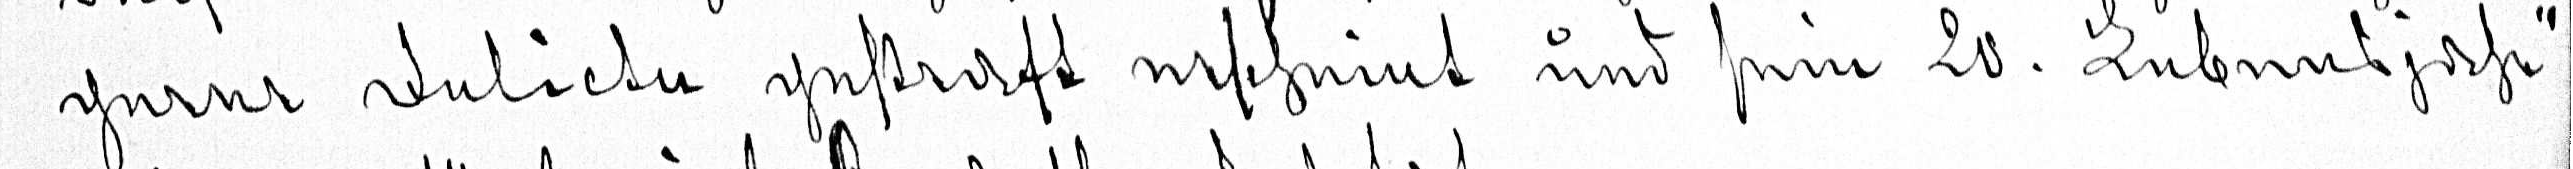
gerer Delicte gestraft erscheint und sein 20. Lebensjahr
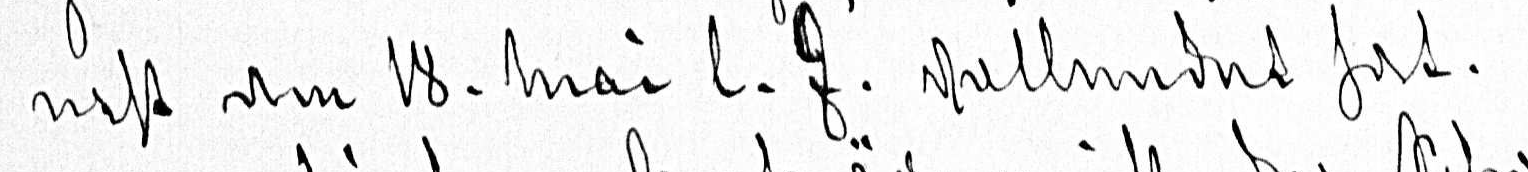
erst am 18. Mai l. J. vollendet hat.
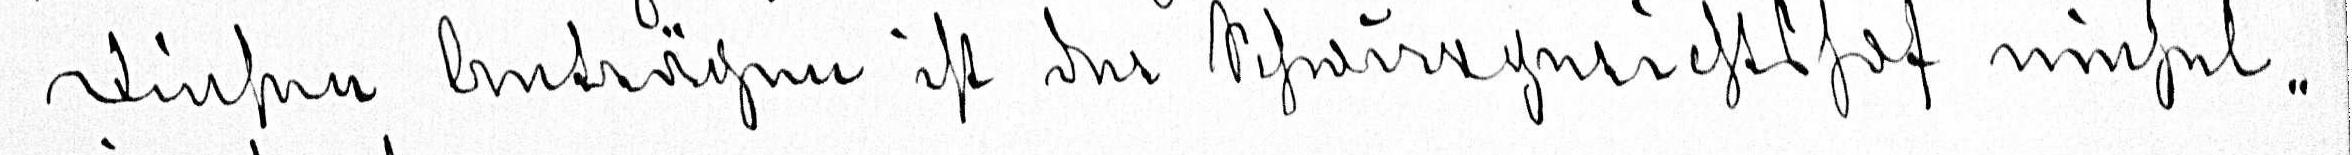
Diesen Anträgen ist der Schwurgerichtshof einhel¬
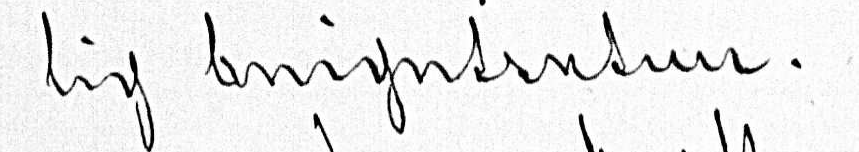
lig beigetreten.
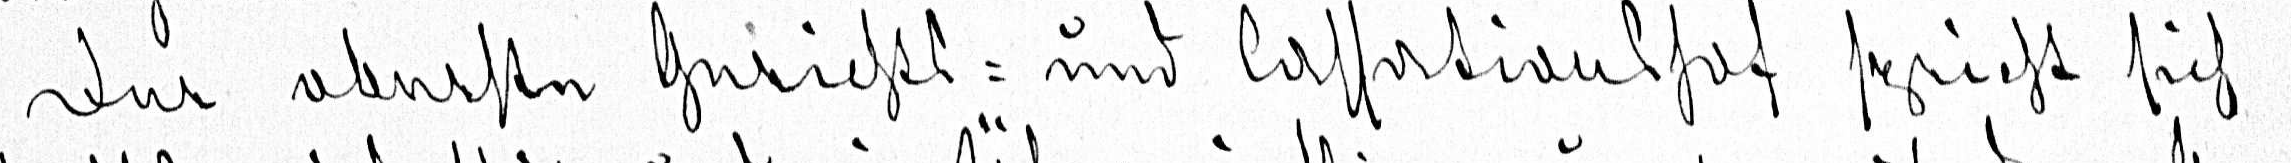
Der obersten Gerichts- und Cassationshof spricht sich
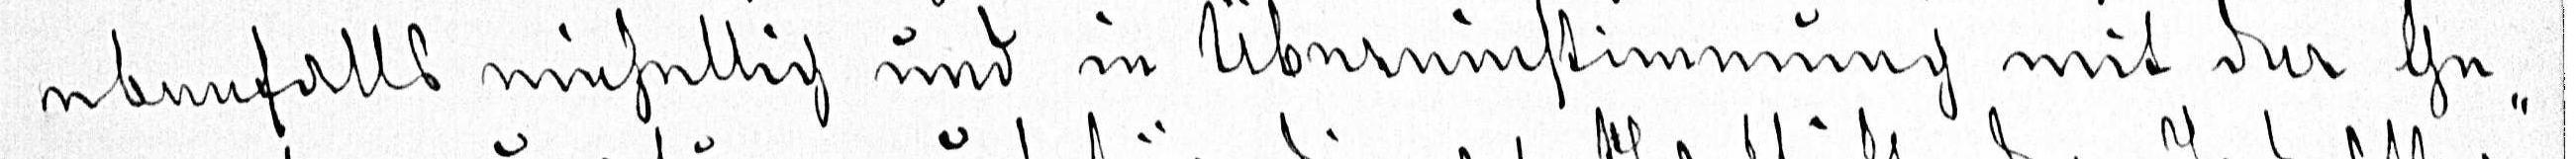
ebenfalls einhellig und in Übereinstimmung mit der Ge¬
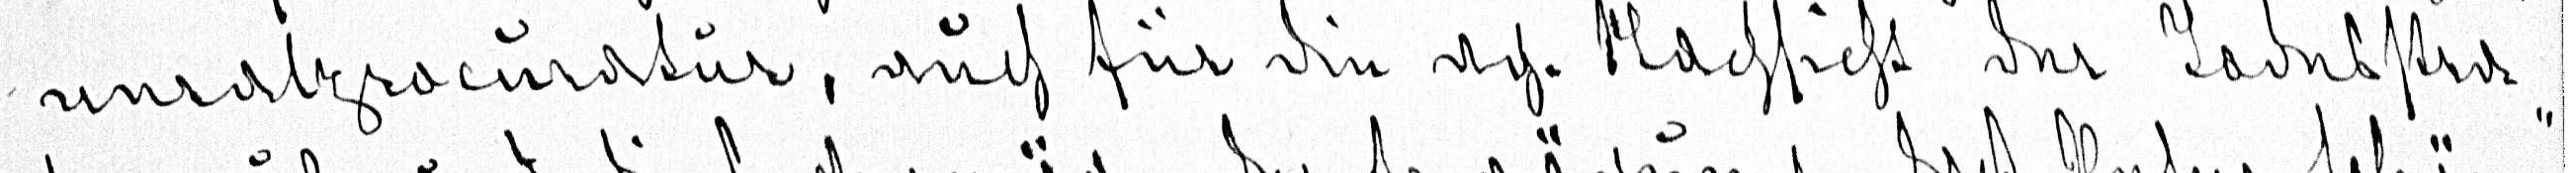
neralprocuratur, auch für die ag. Nachsicht der Todesstra¬
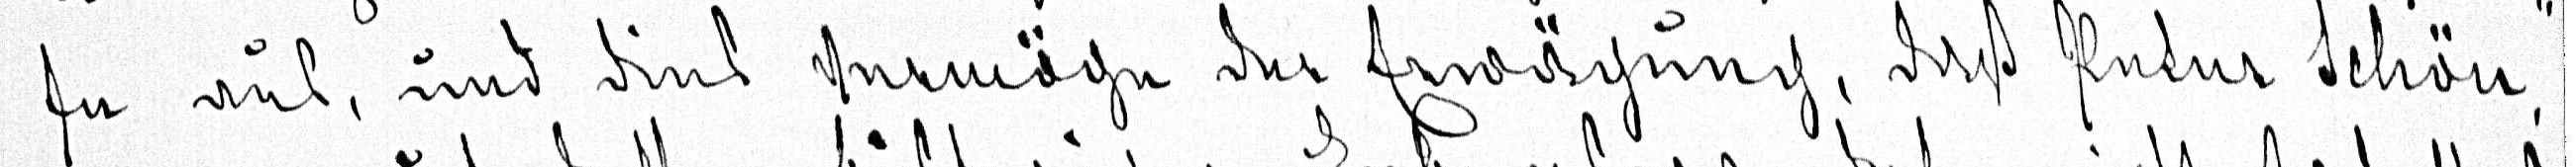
fe aus, und dies vermöge der Erwägung, daß Peter Schön
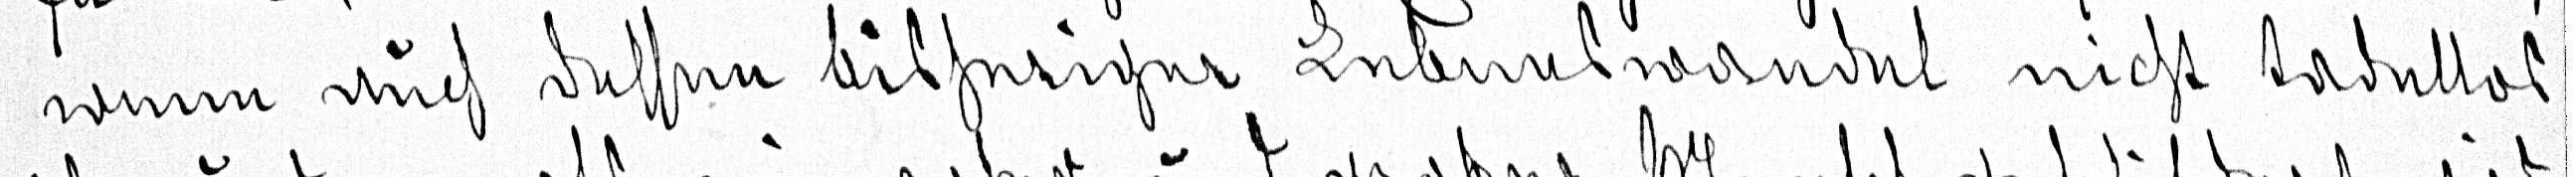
wenn auch dessen bisheriger Lebenswandel nicht tadellos
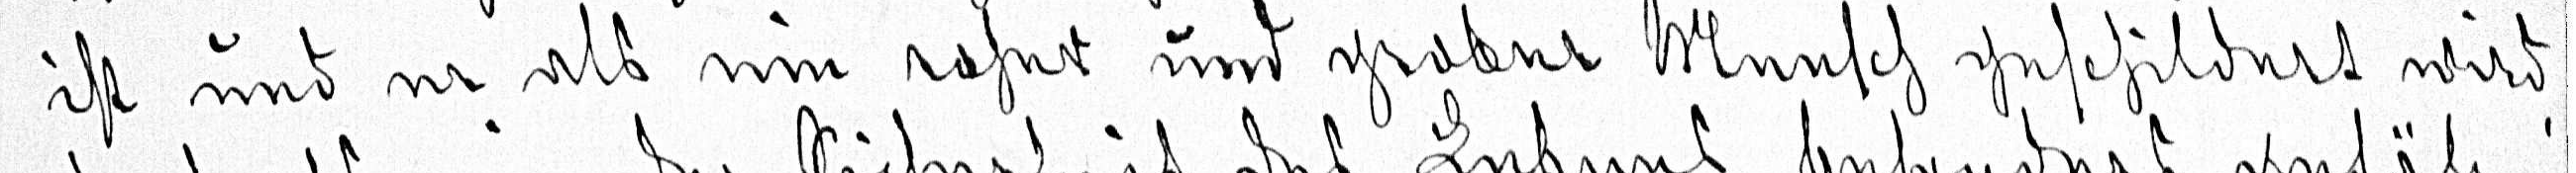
ist und er als ein roher und grober Mensch geschildert wird
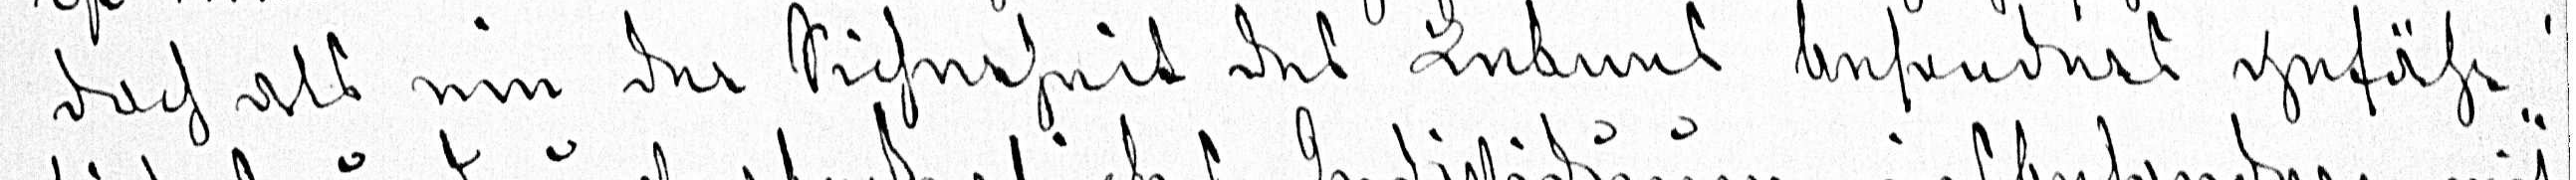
doch als ein der Sicherheit des Lebens besonders gefähr¬
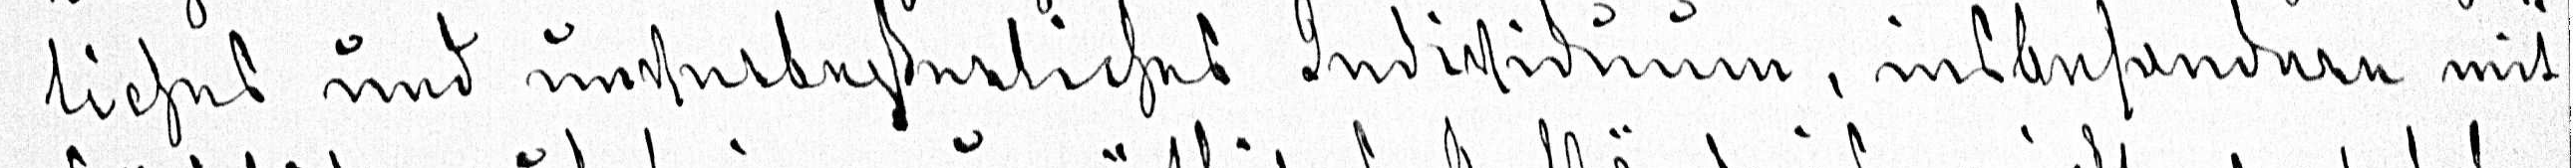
liches und unverbeßerliches Individuum, insbesondere mit
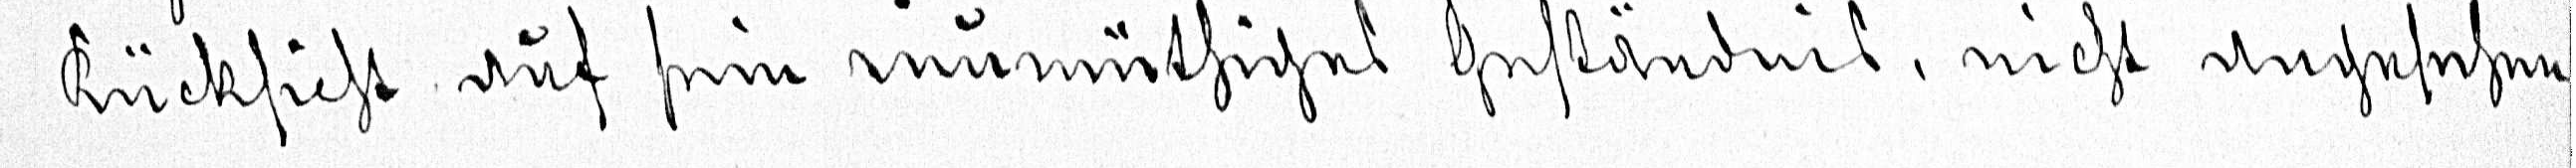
Rücksicht auf sein reumüthiges Geständnis, nicht angesehen
